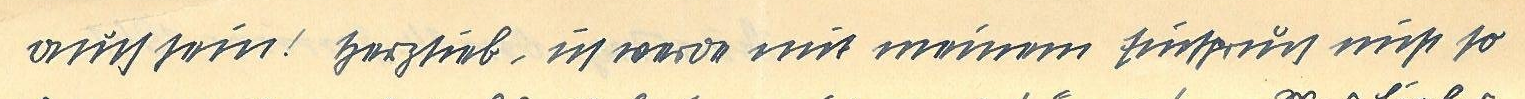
auch sein! Herzlieb, ich werde mit meinem Einspruch nicht so
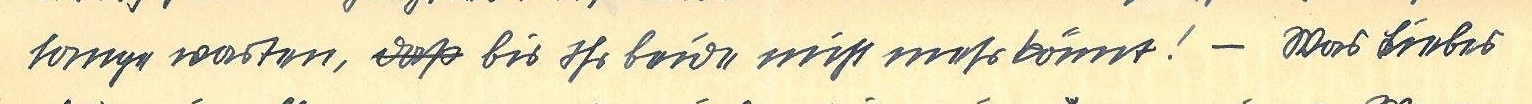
lange warten, daß bis Ihr beide nicht mehr könnt! – Was Liebes
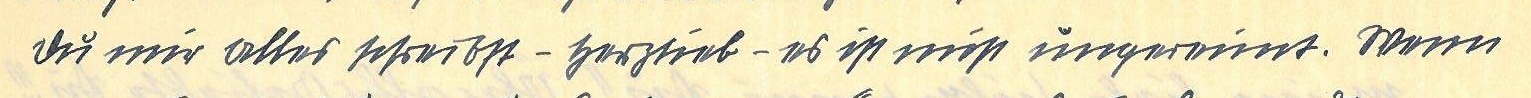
Du mir alles schreibst – Herzlieb – es ist nicht ungereimt. Wenn
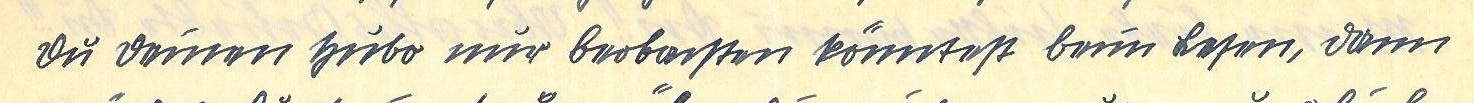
Du Deinen Hubo beobachten könntest beim Lesen, dann
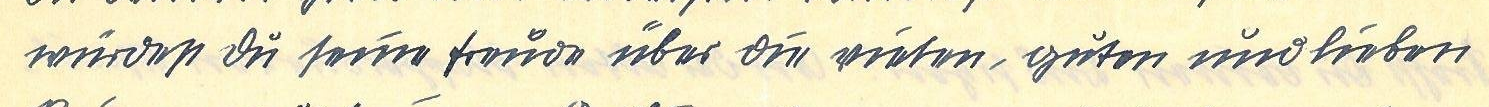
würdest Du seine Freude über die vielen, guten und lieben
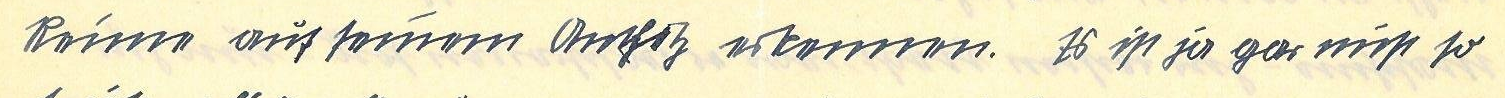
Reime auf seinem Anhtlitz erkennen. Es ist ja gar nicht so
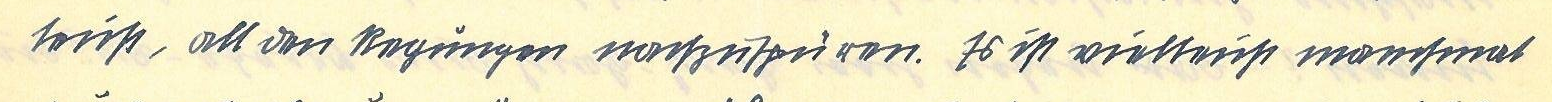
leicht, all den Regungen nachzuspüren. Es ist vielleicht manchmal
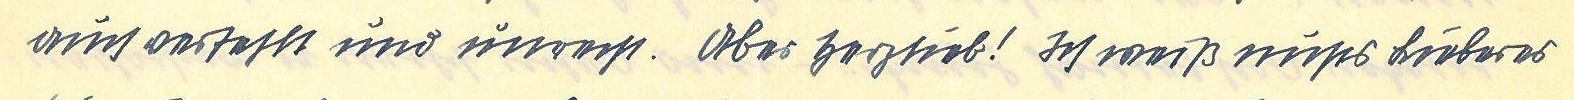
auch verfehlt und unrecht. Aber Herzlieb! Ich weiß nichts Lieberes
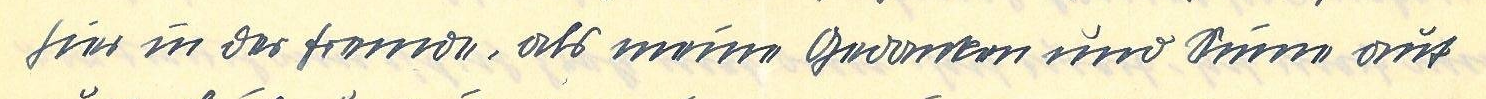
hier in der Fremde, als meine Gedanken und Sinne auf
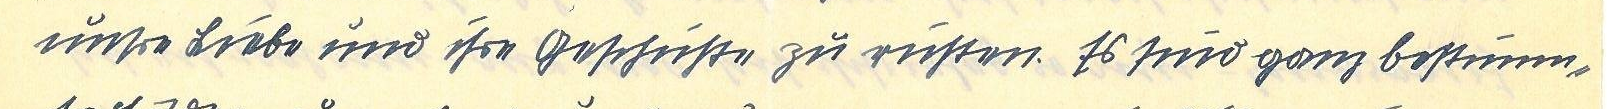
unsre Liebe und Ihre Geschichte zu richten. Es sind ganz bestimm¬
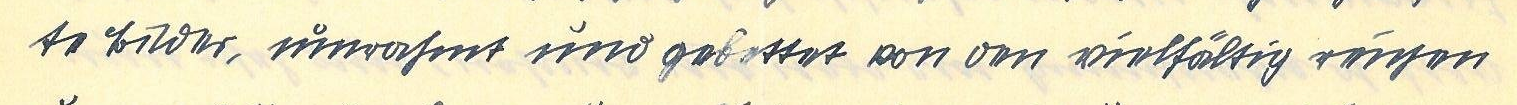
te Bilder, umrahmt und gebettet von den vielfältig reichen
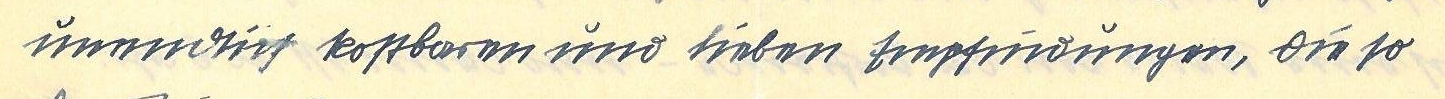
unendlich kostbaren und lieben Empfindungen, die so
